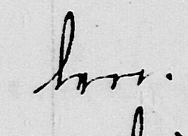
len.
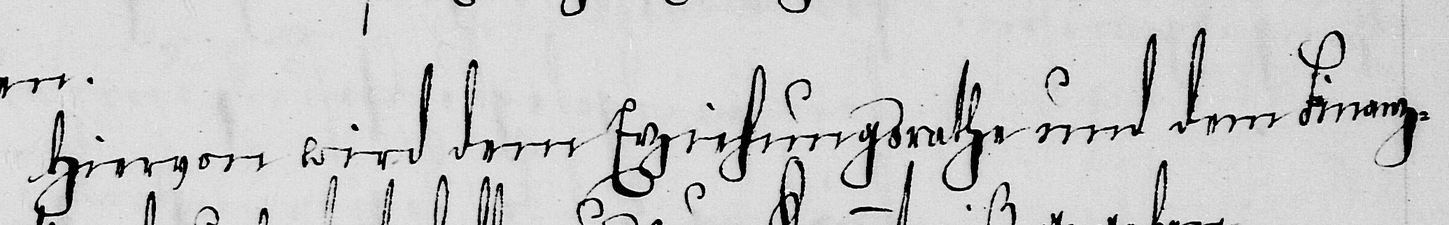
Hiervon wird dem Erziehungsrathe und dem Finanz¬
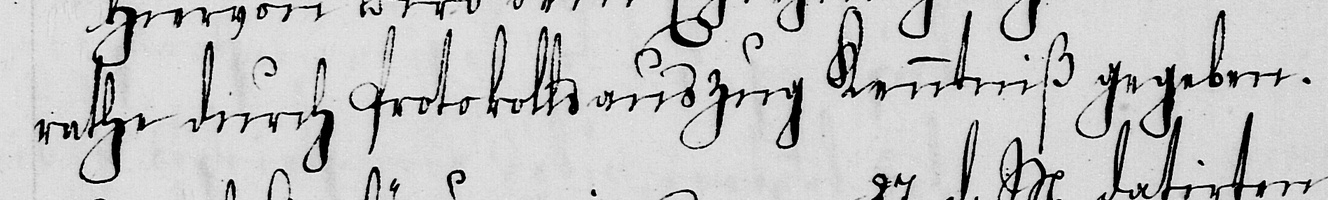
rathe durch Protokollsauszug Kenntniß gegeben.
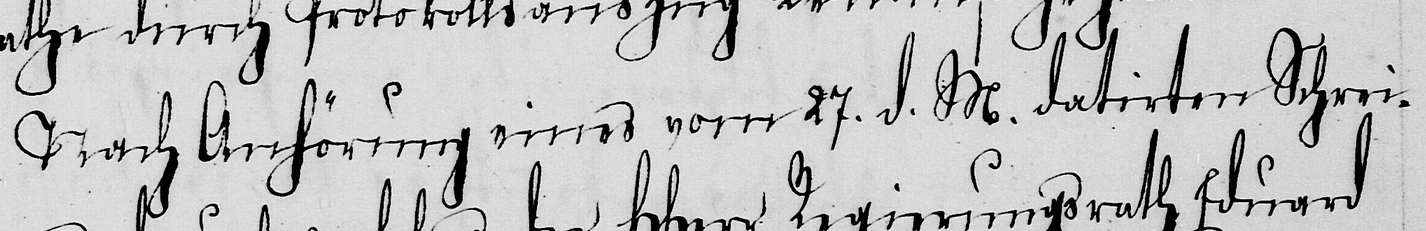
Nach Anhörung eines vom 27. d. M. datirten Schrei¬
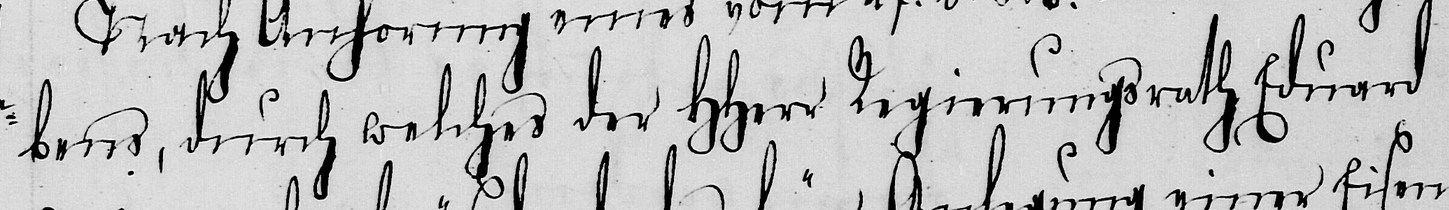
bens, durch welches der HHerr Regierungsrath Eduard
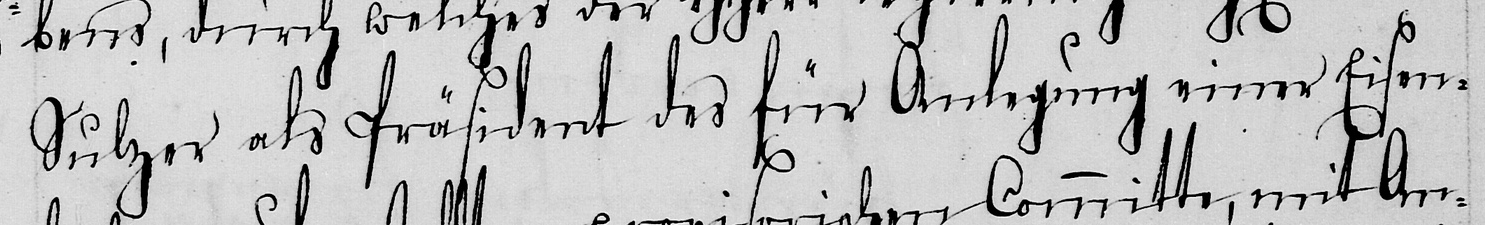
Sulzer als Präsident des für Anlegung einer Eisen¬
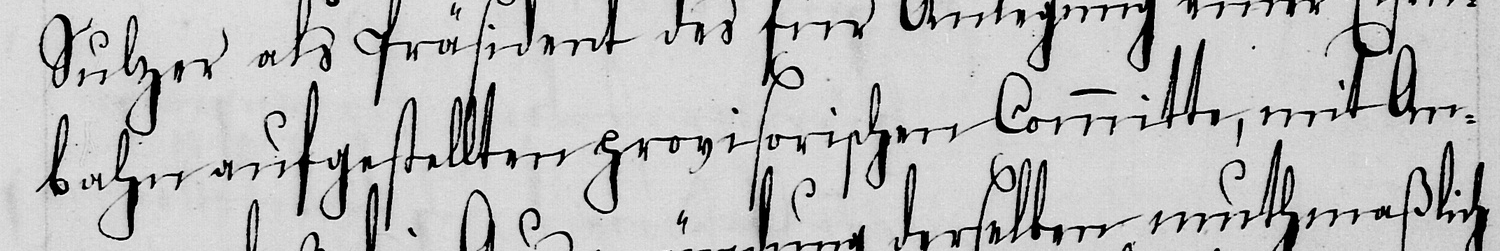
bahn aufgestellten provisorischen Committe, mit An¬
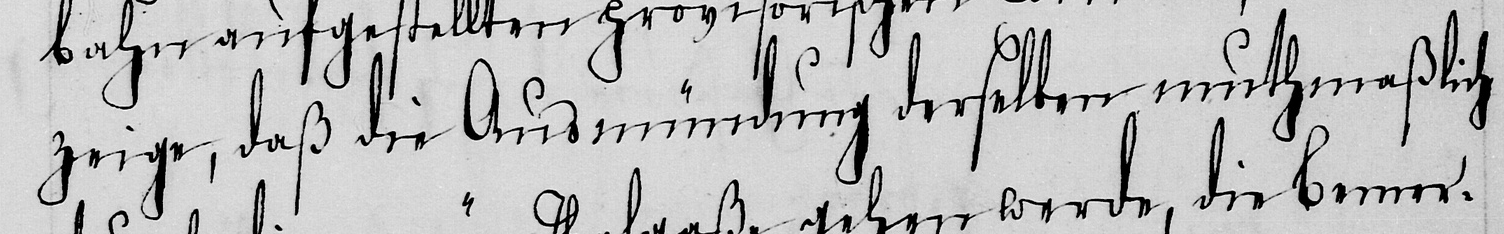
zeige, daß die Ausmündung derselben muthmaßlich
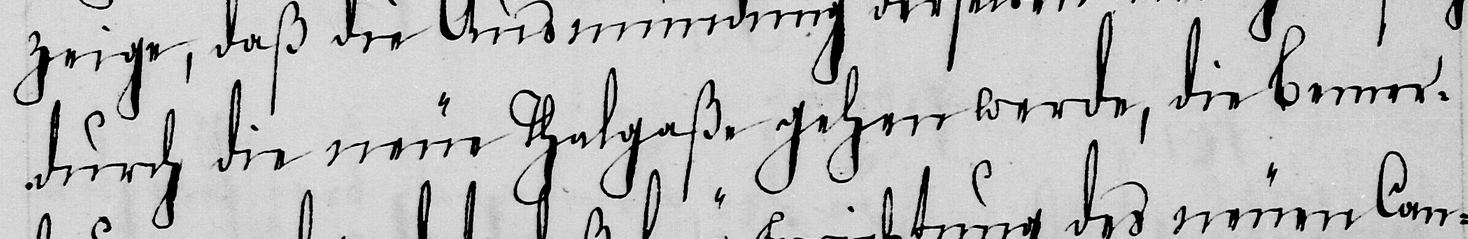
durch die neue Thalgasse gehen werde, die Bemer¬
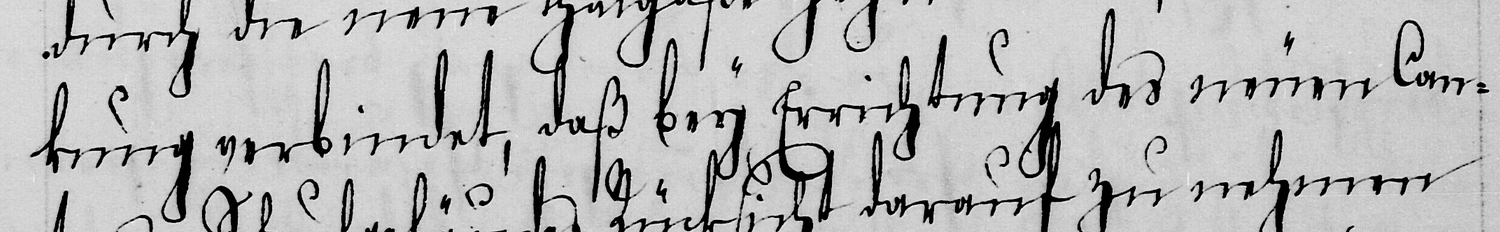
kung verbindet, daß bey Errichtung des neuen Can¬
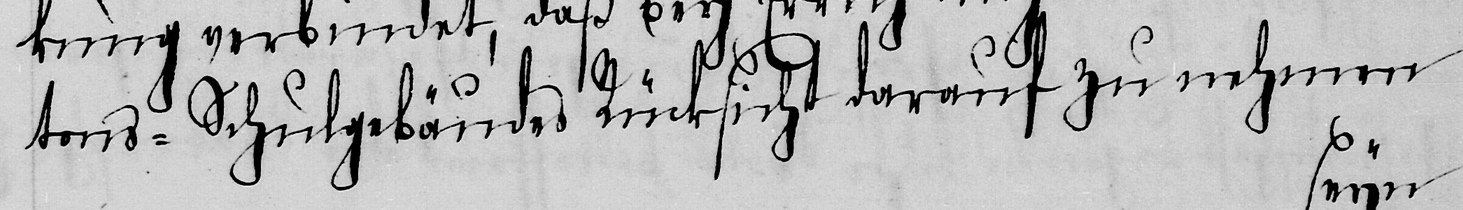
tons-Schulgebäudes Rücksicht darauf zu nehmen
